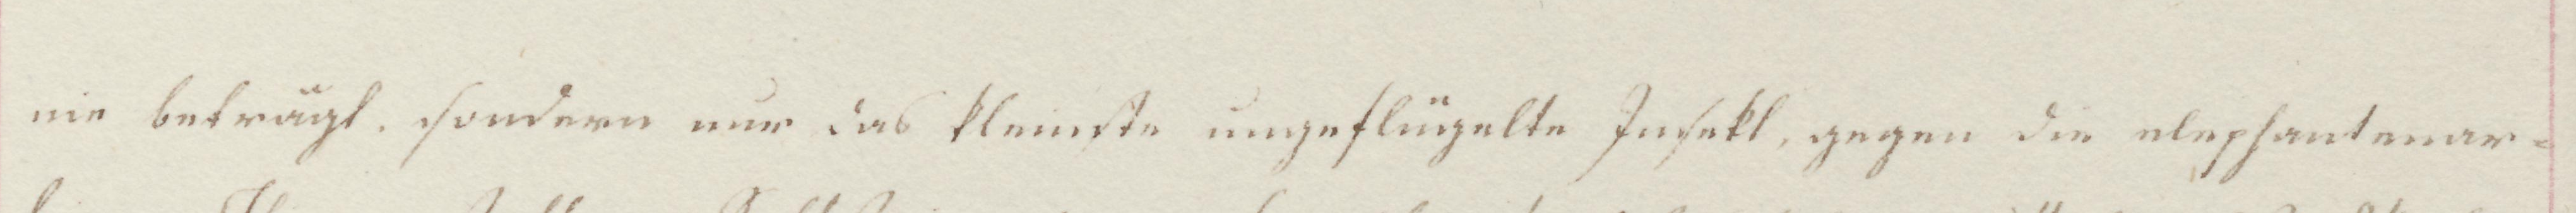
nie beträgt, sondern nur das kleinste ungeflügelte Insekt, gegen die elephantenar-
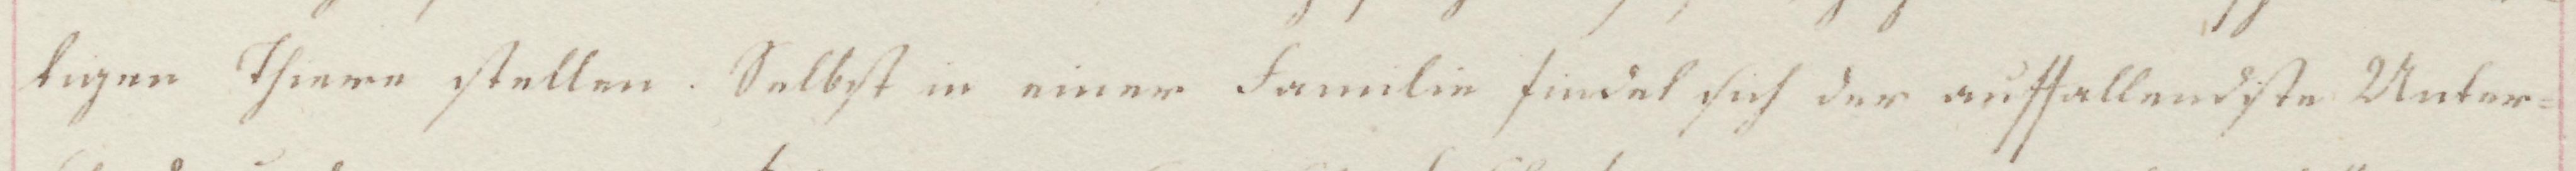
tigen Thiere stellen. Selbst in einer Familie findet sich der auffallendste Unter-
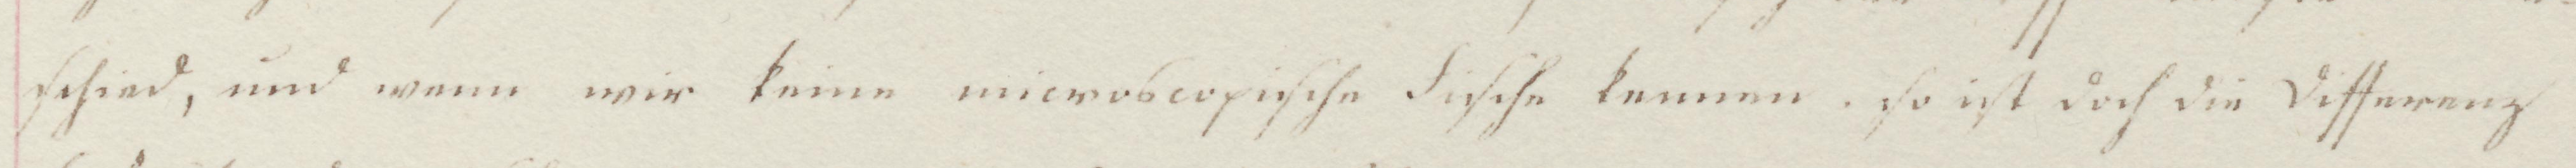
schied, und wenn wir keine microscopische Fische kennen, so ist doch die Differenz
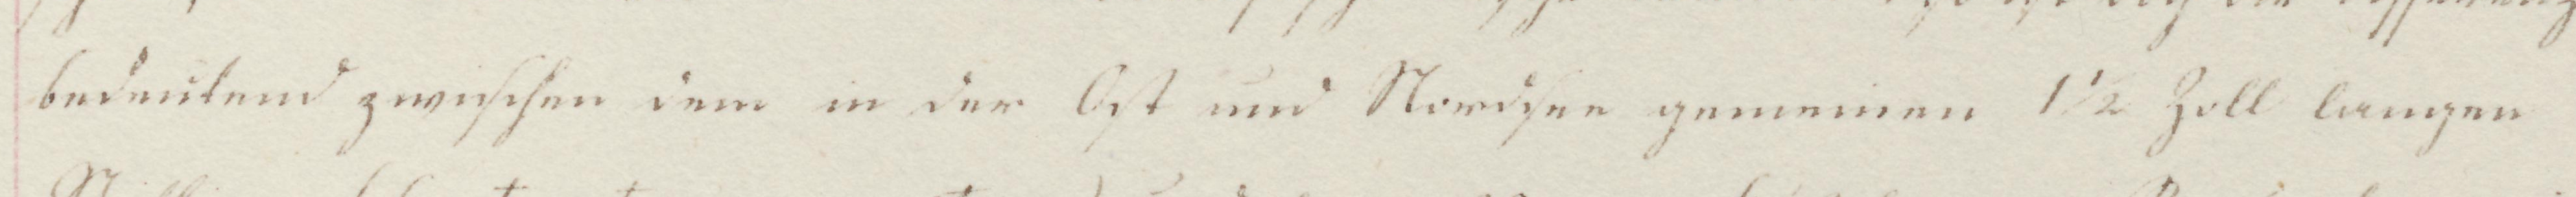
bedeutend zwischen dem in der Ost und Nordsee gemeinen 1½ Zoll langen
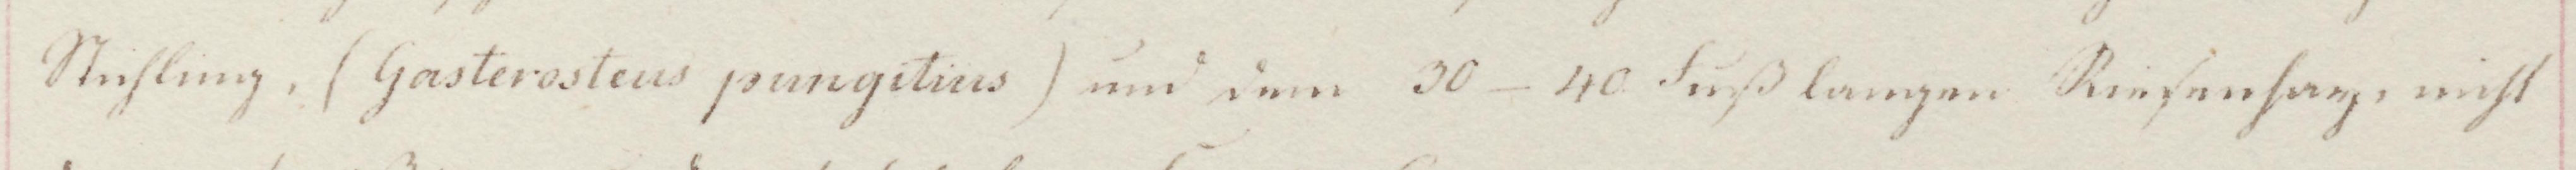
Stichling, und dem 30–40 Fuß langen Riesenhay, nicht
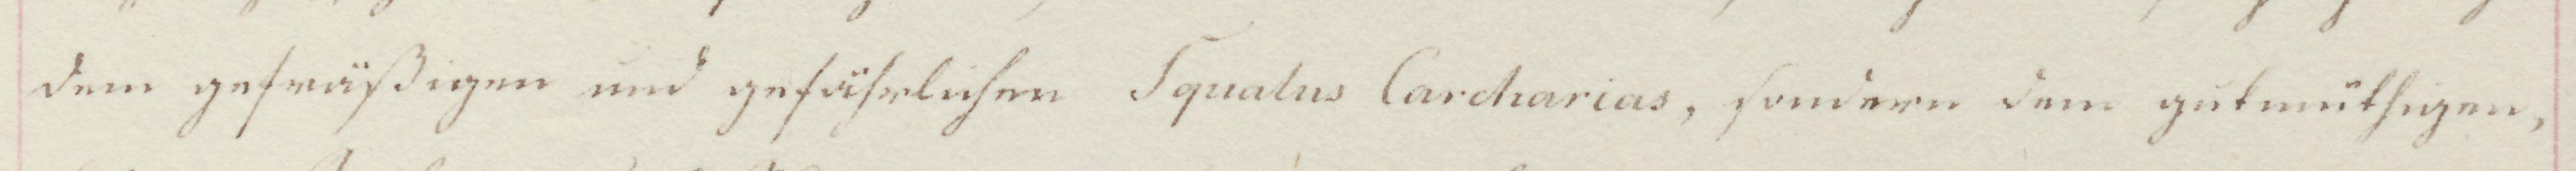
dem gefräßigen und gefährlichen Squalus Carcharias, sondern dem gutmüthigen,
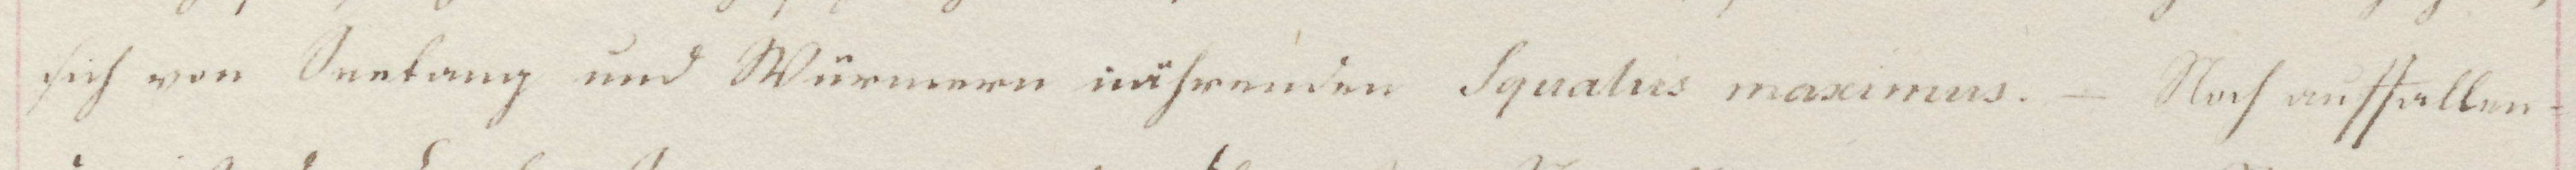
sich von Seetang und Würmern nährenden Squalus maximus. – Noch auffallen-
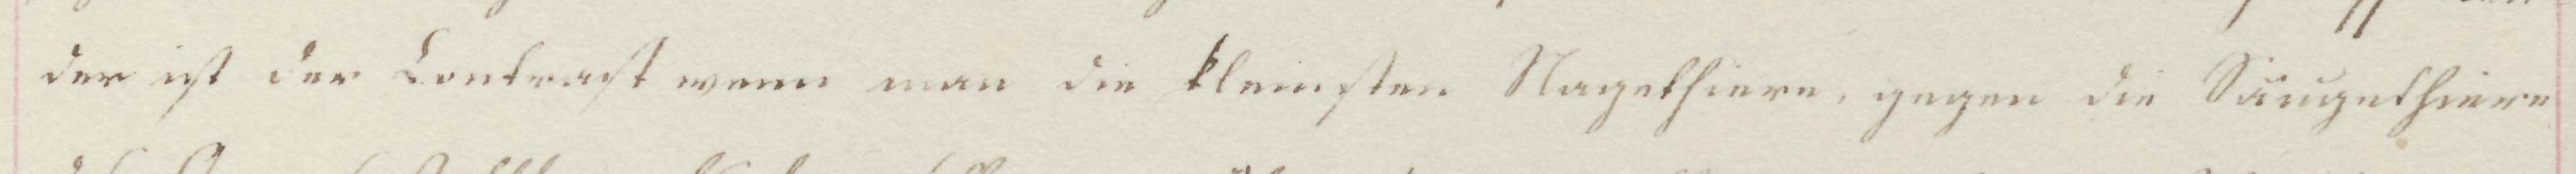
der ist der Contrast wenn man die kleinsten Nagethiere, gegen die Säugethiere
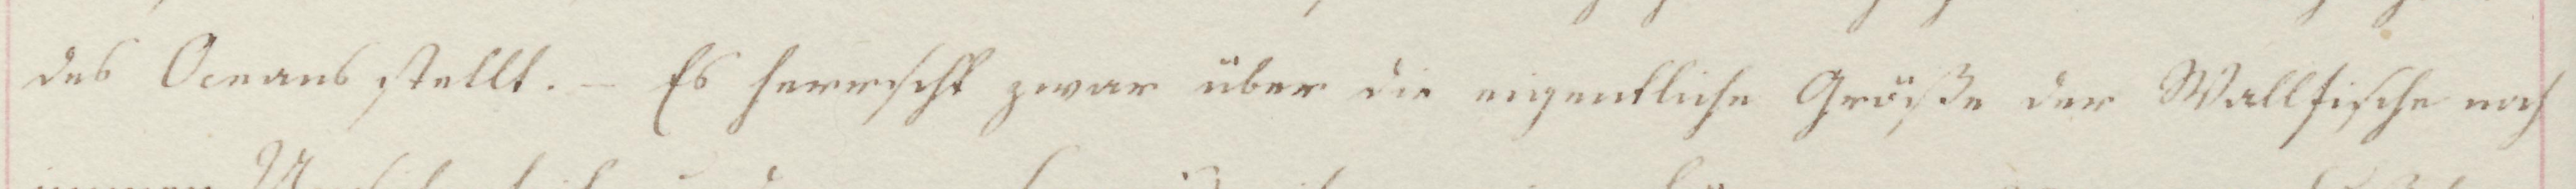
des Oceans stellt. – Es herrscht zwar über die eigentliche Größe der Wallfische noch
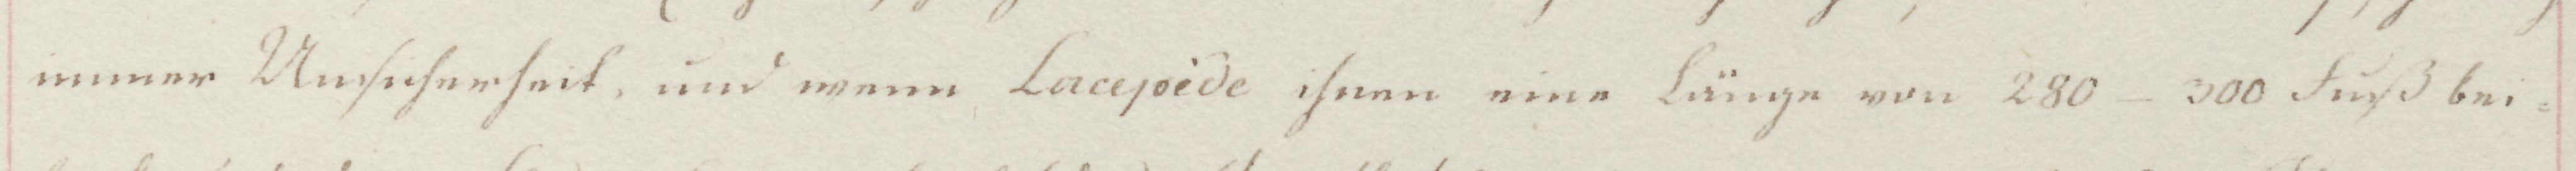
immer Unsicherheit, und wenn Lacepède ihnen eine Länge von 280–300 Fuß bei-
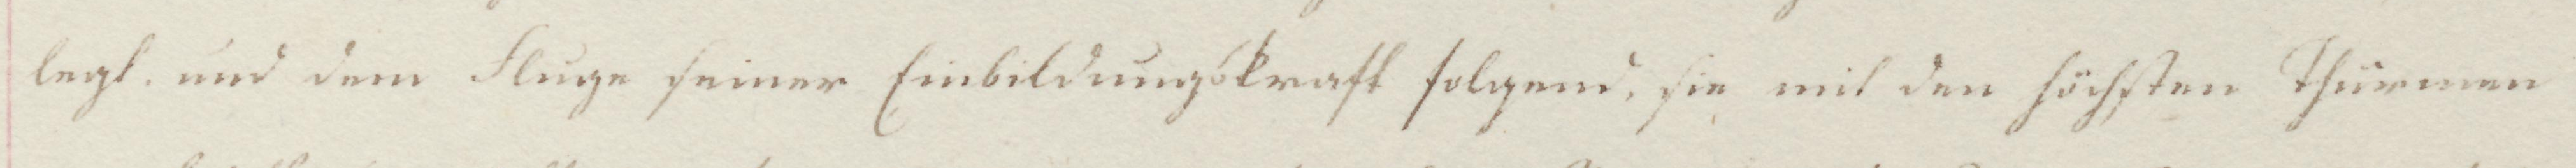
legt, und dem Fluge seiner Einbildungskraft folgend, sie mit den höchsten Thürmen
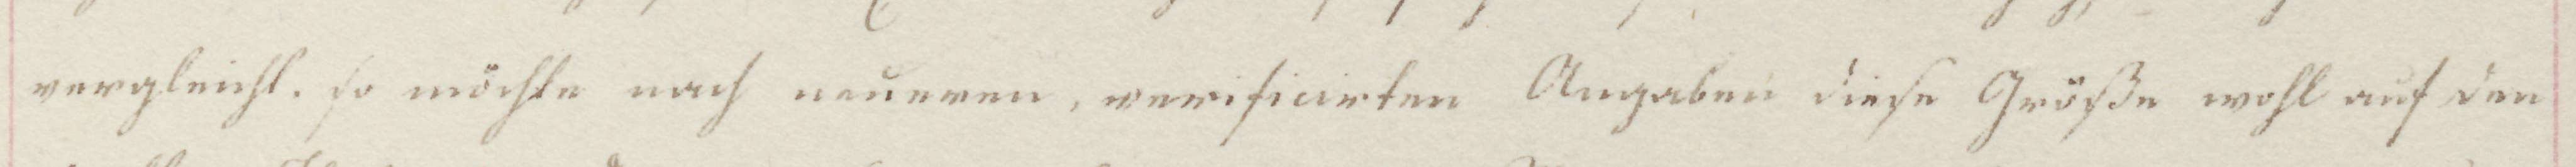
vergleicht, so möchte nach neueren, verificirten Angaben diese Größe wohl auf den
